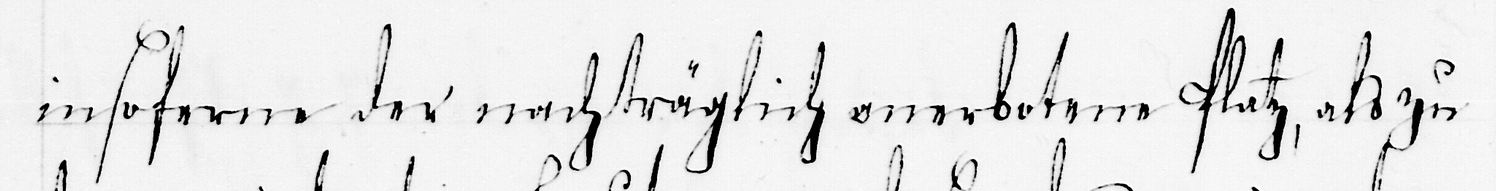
insoferne der nachträglich anerbotene Platz, als zu
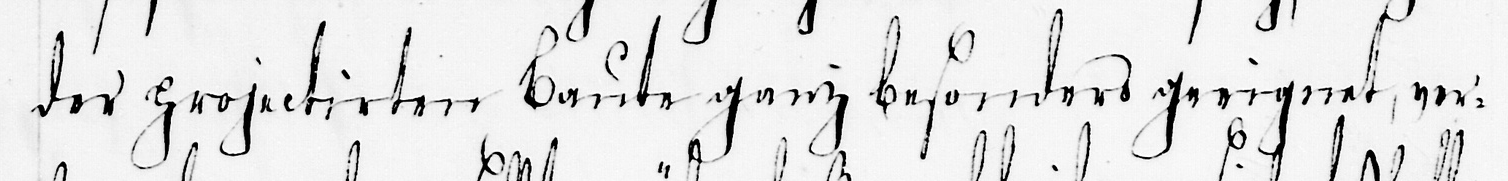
der projectirten Baute ganz besonders geeignet, ver¬
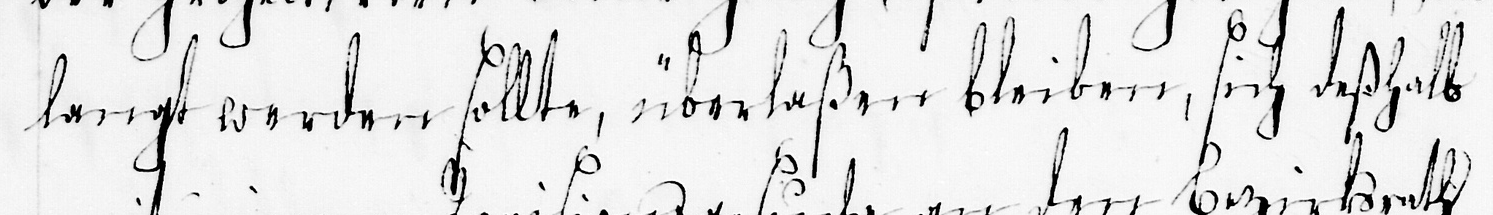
langt werden sollte, überlaßen bleiben, sich deßhalb
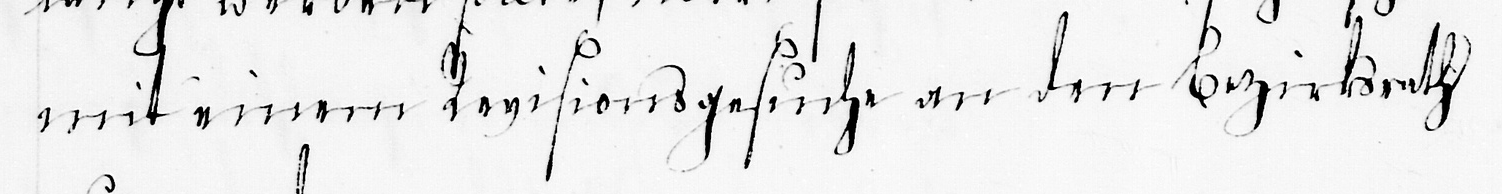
mit einem Revisionsgesuche an den Bezirksrath
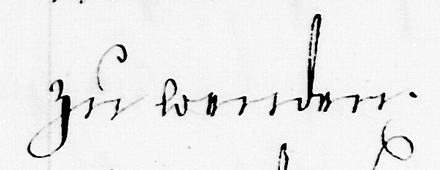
zu wenden.
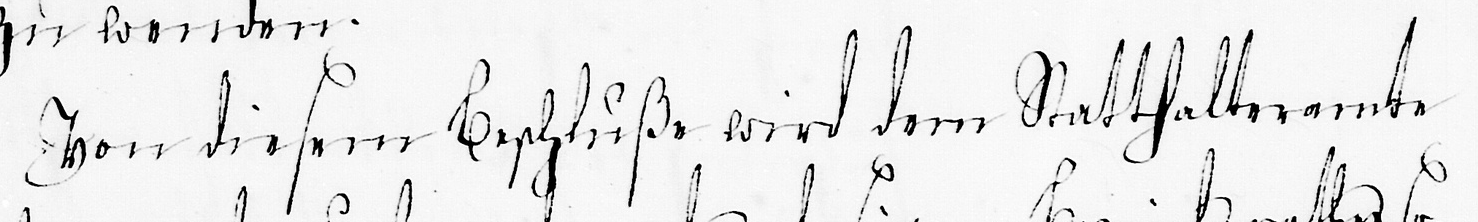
Von diesem Beschluße wird dem Statthalteramte
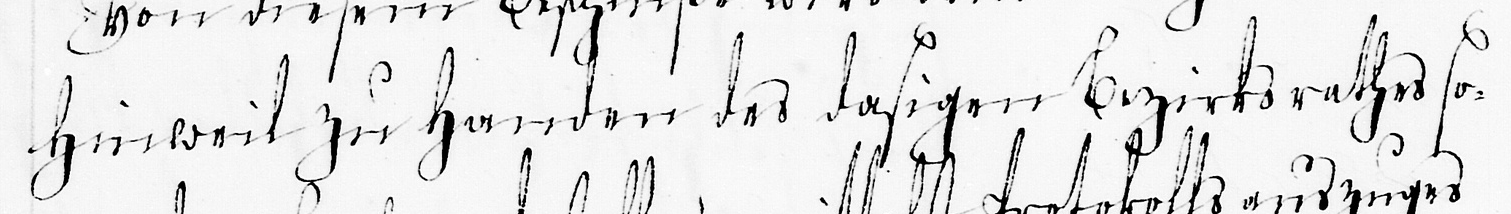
Hinweil zu Handen des dasigen Bezirksrathes s¬
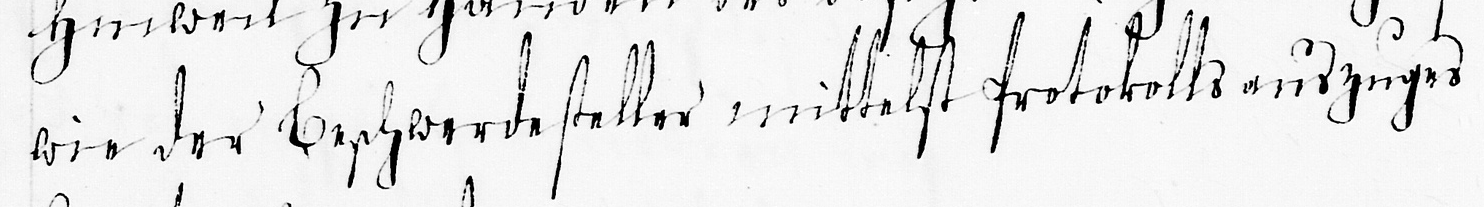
owie der Beschwerdesteller mittelst Protokollsauszuges
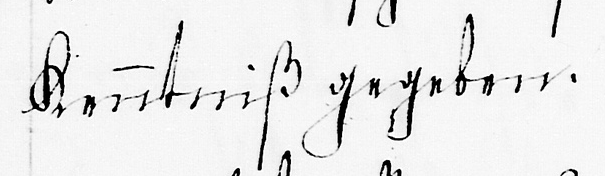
Kenntniß gegeben.
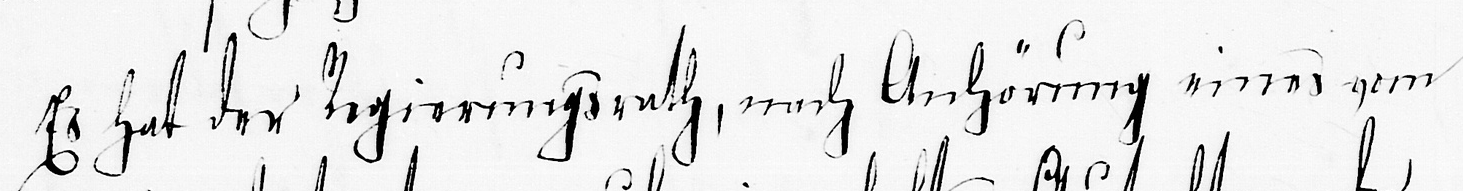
Es hat der Regierungsrath, nach Anhörung eines vom
